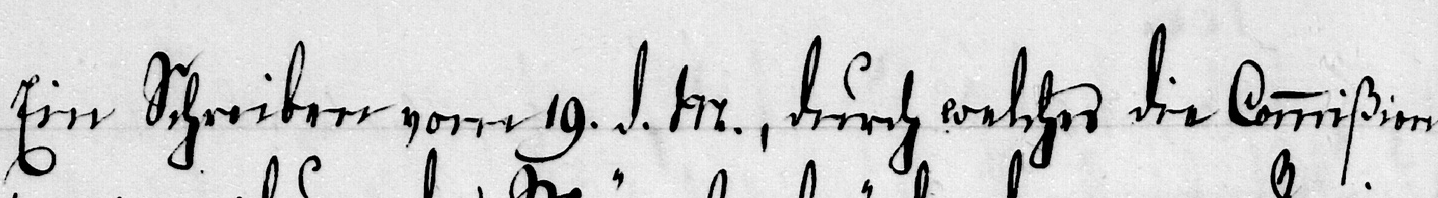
Ein Schreiben vom 19. d. M., durch welches die Commißion
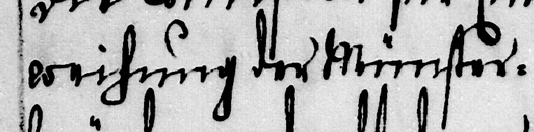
weihung der Münster¬
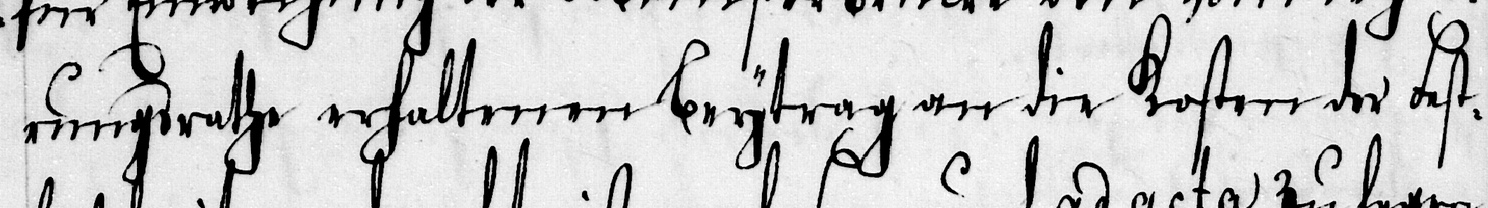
rungsrathe erhaltenen Beytrag an die Kosten der Fest¬
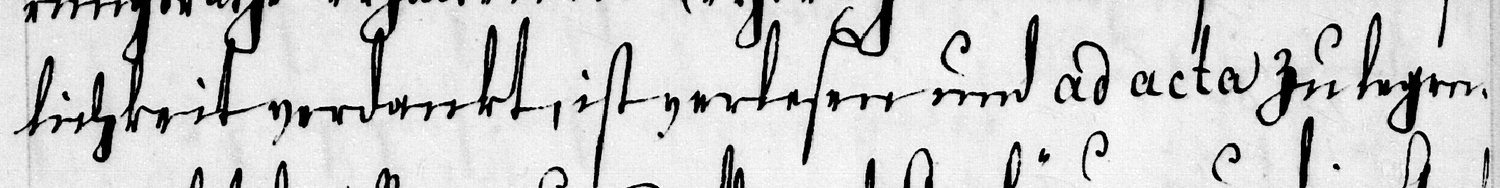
lichkeit verdankt, ist verlesen und ad acta zu legen.
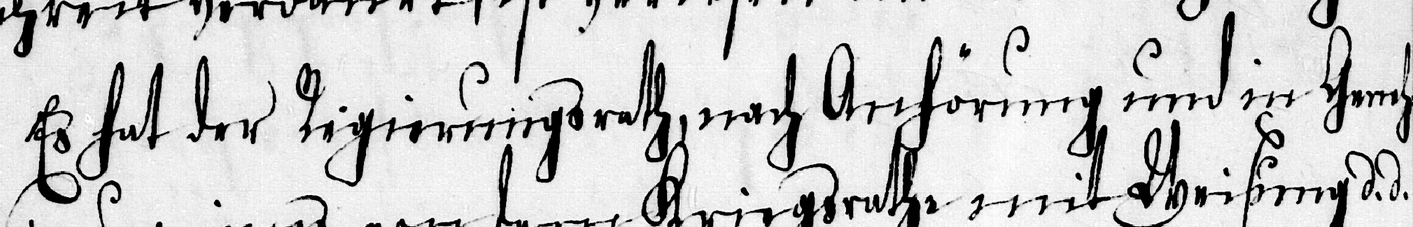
Es hat der Regierungsrath nach Anhörung und in Gen¬
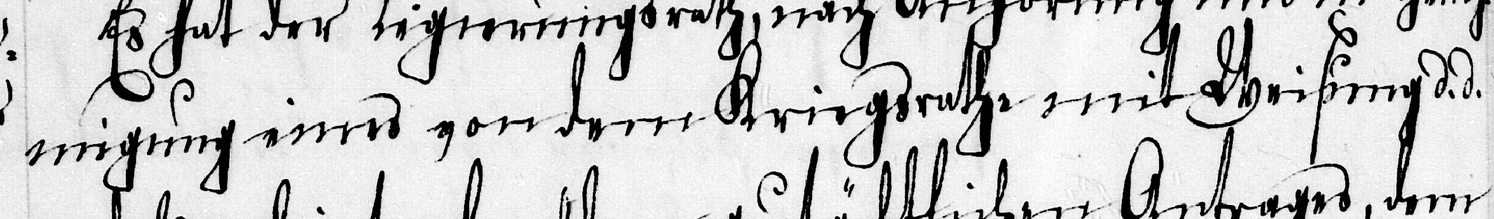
migung eines von dem Kriegsrathe mit Weisung d. d.
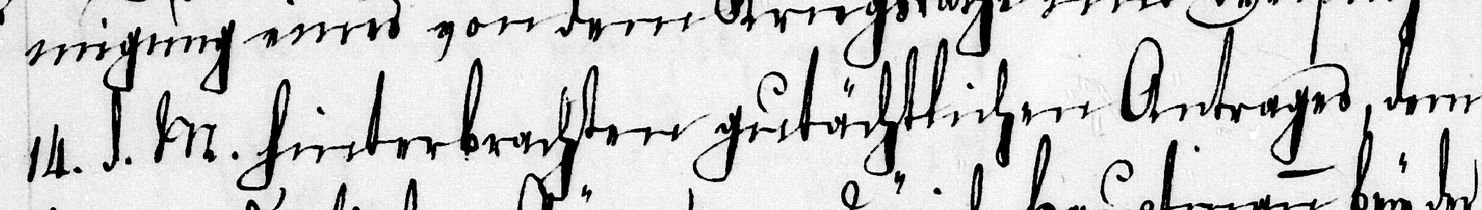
14. d. M. hinterbrachten gutächtlichen Antrages, dem
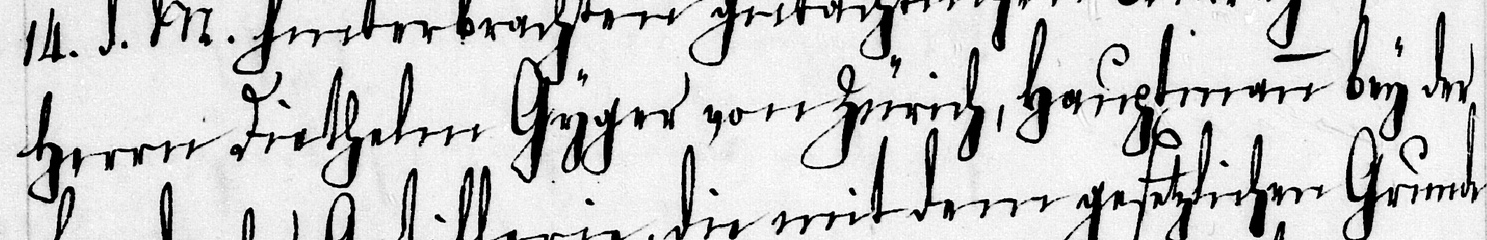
Herrn Diethelm Gyger von Zürich, Hauptmann bey der
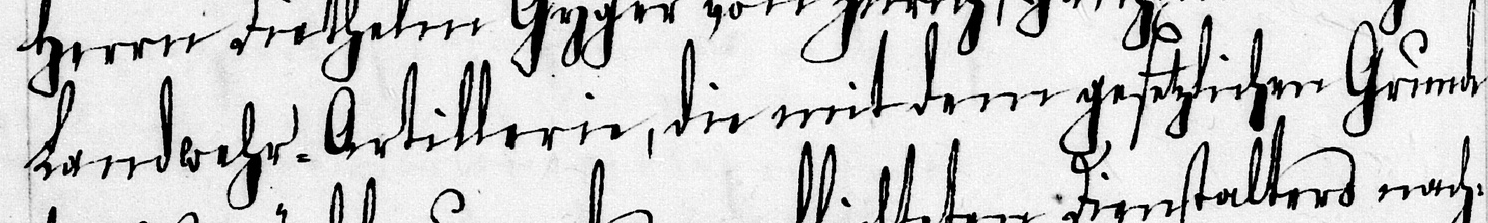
Landwehr-Artillerie, die mit dem gesetzlichen Grunde
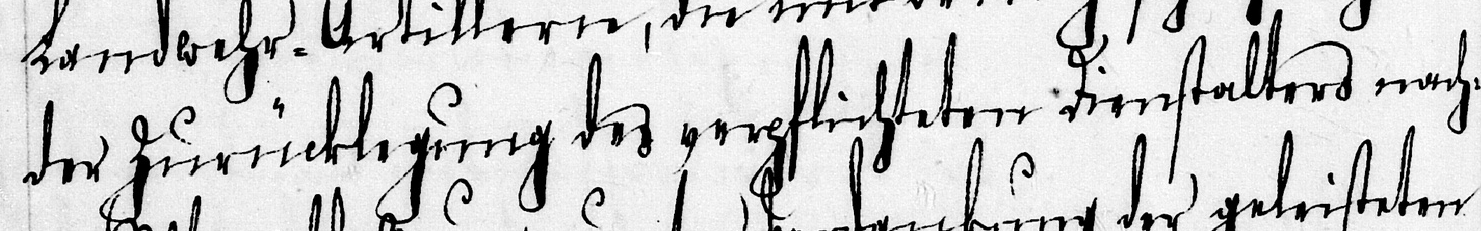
der Zurücklegung des verpflichteten Dienstalters nac¬
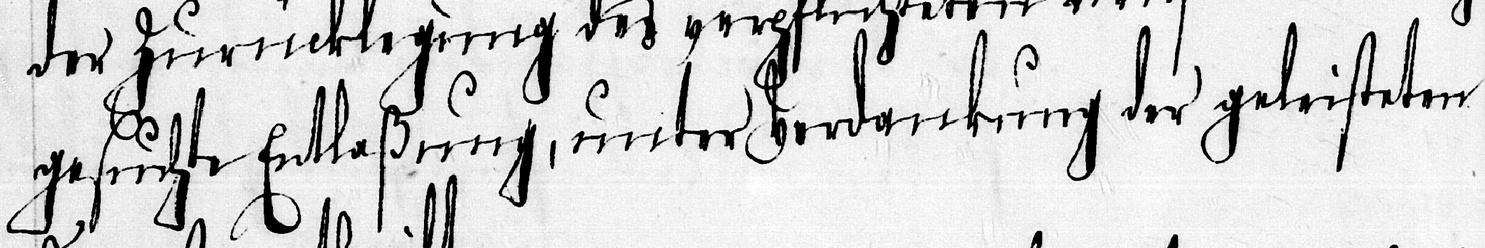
hgesuchte Entlaßung, unter Verdankung der geleisteten
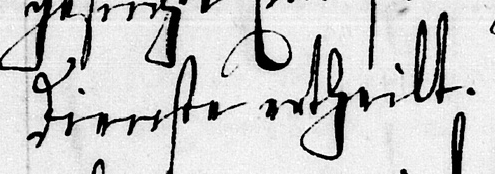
Dienste ertheilt.
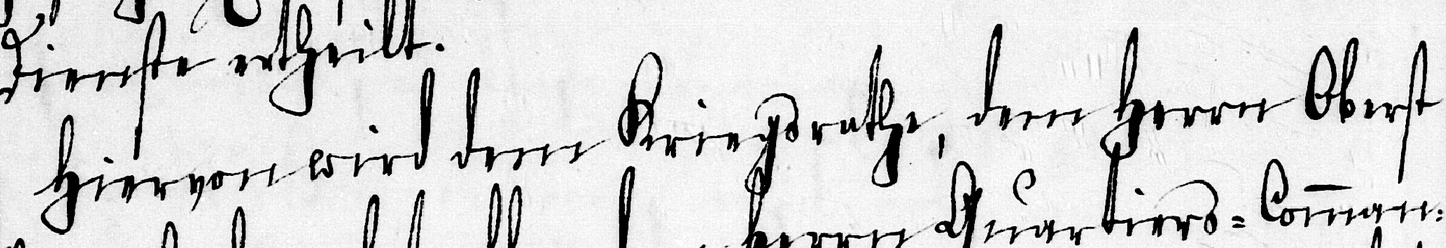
Hiervon wird dem Kriegsrathe, dem Herrn Oberst
